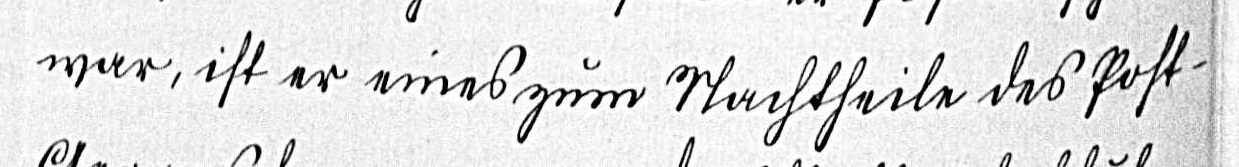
war, ist er eines zum Nachtheile des Post-
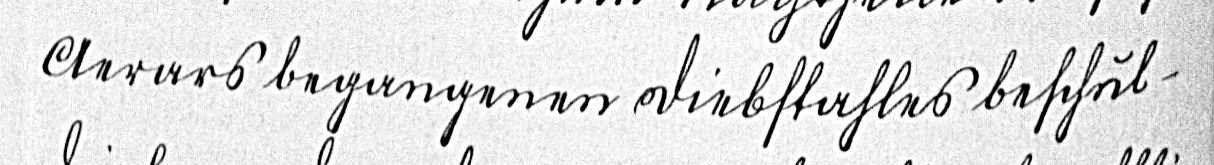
Aerars begangenen Diebstahles beschul¬
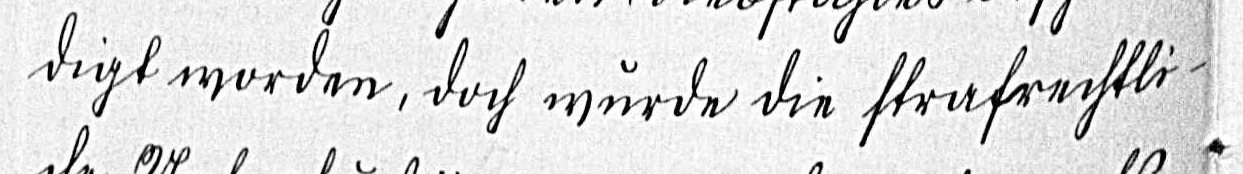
digt worden, doch wurde die strafrechtli¬
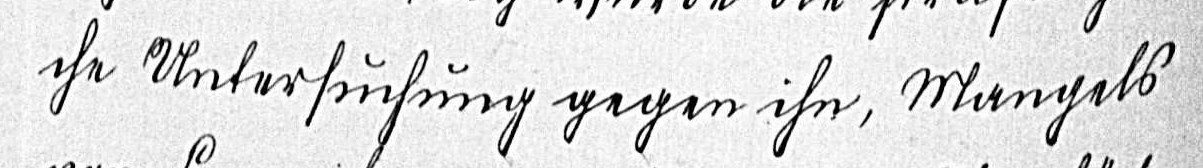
che Untersuchung gegen ihn, Marngels
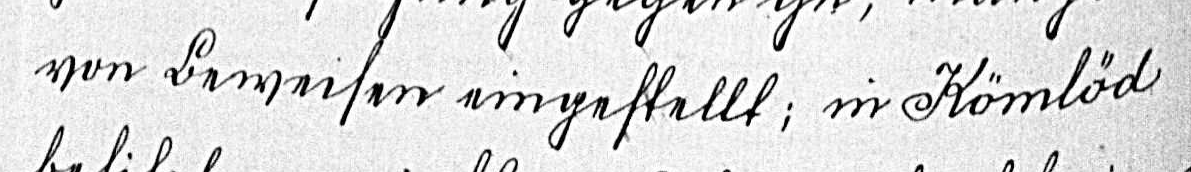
von Beweisen eingestellt; in Kőmlőd
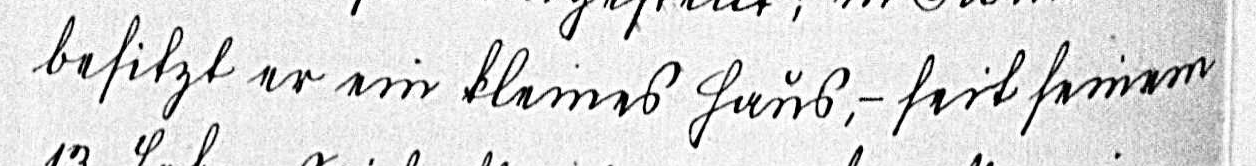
besitzt er ein kleines Haus, – seit seinem
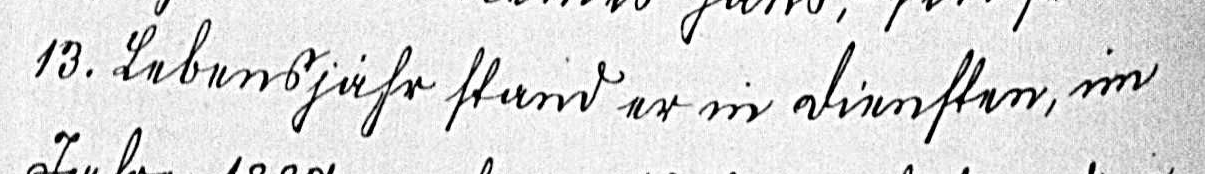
13. Lebensjahr stand er in Diensten, im
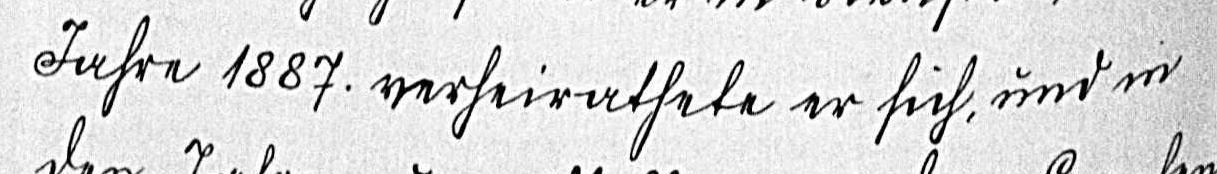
Jahre 1887 verheirathete er sich, und in
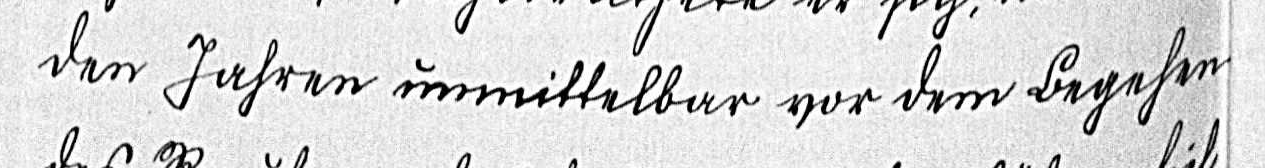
den Jahren unmittelbar vor dem Begehen
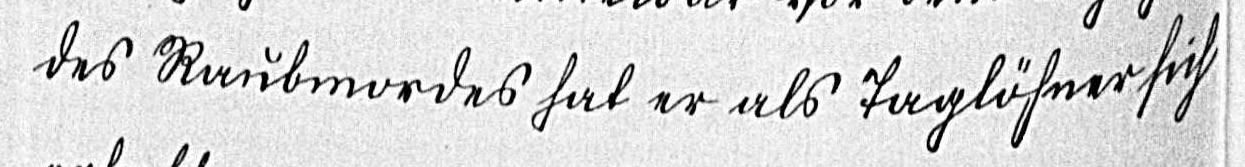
des Raubmordes hat er als Taglöhner sich
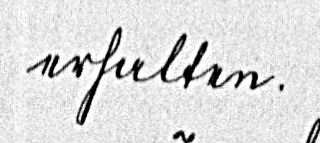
erhalten.
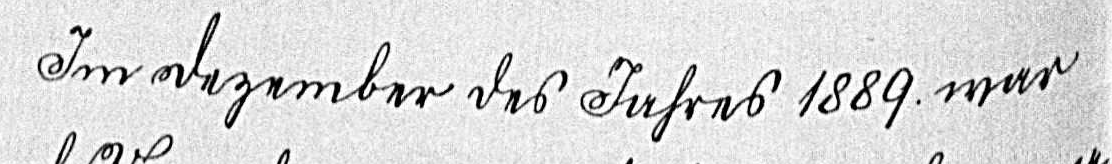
Im Dezember des Jahres 1889 war
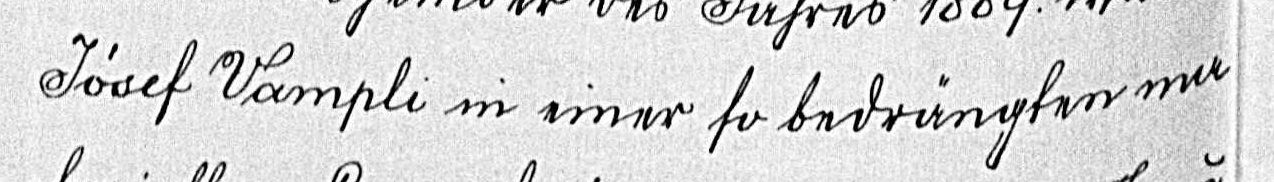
Jósef Vampli in einer so bedrängten ma¬
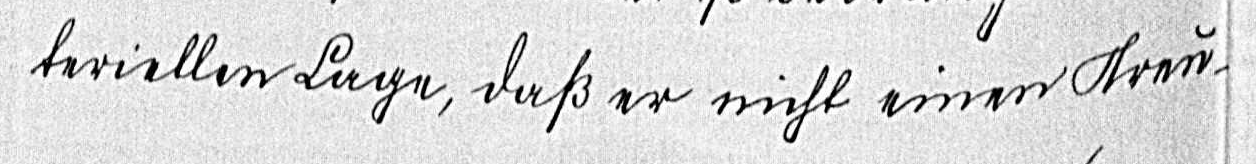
teriellen Lage, daß er nicht einen Kreu¬
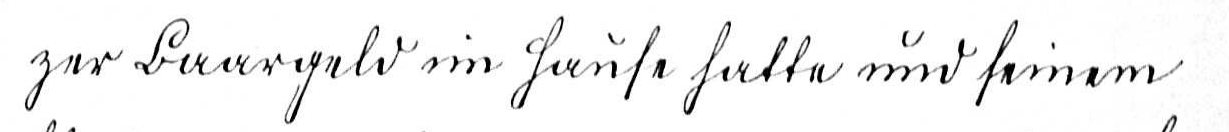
zer Baargeld im Hause hatte und seinem
